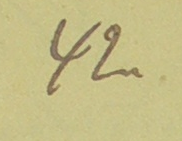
42
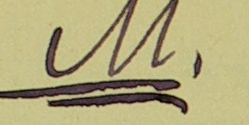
M
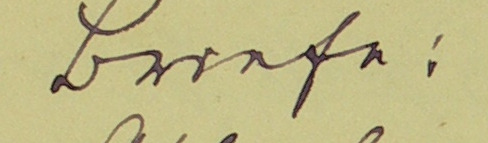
Briefe
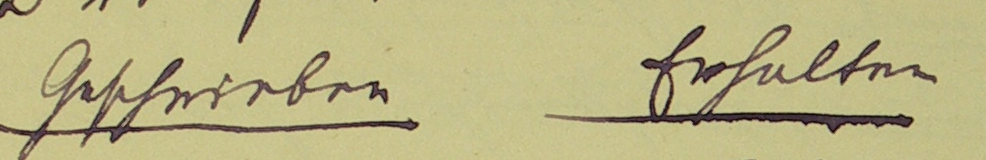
Geschrieben Erhalten
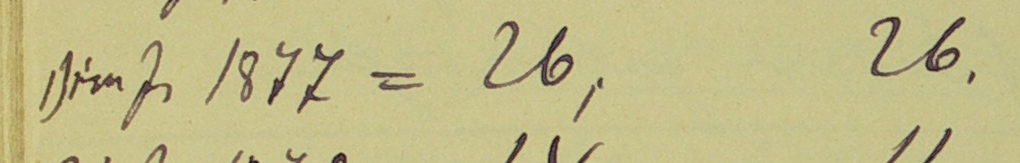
1.) Im Jahre 1877 = 26 26
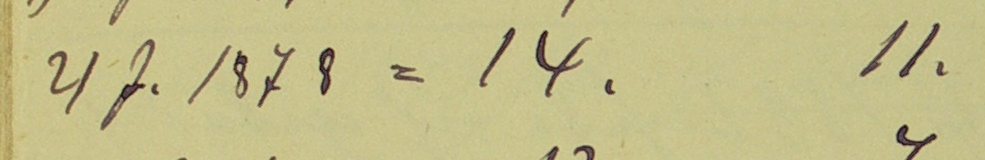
2.) * 1878 = 14 11
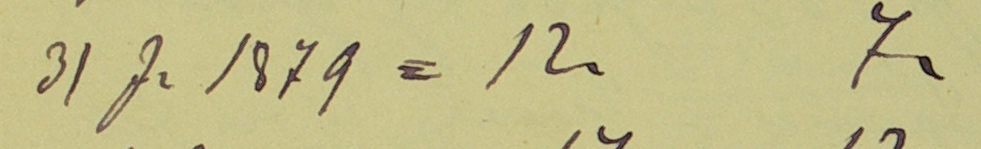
3.) * 1879 = 12 7
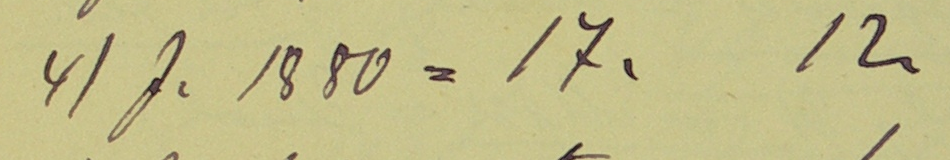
4.) * 1880 = 17 12
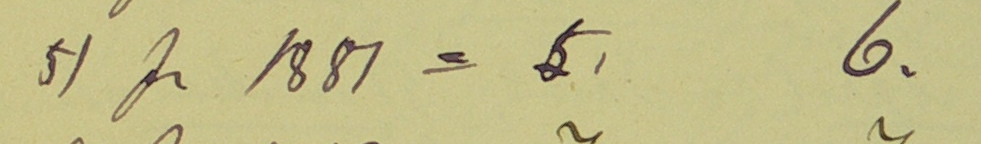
5.) * 1881 = 5 6
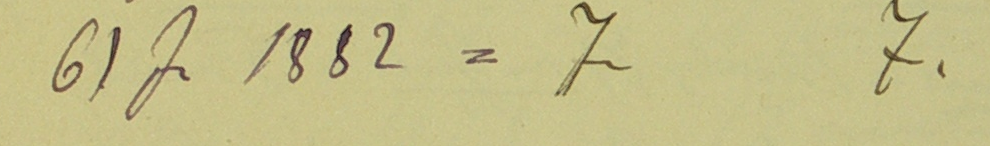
6.) * 1882 = 7 7
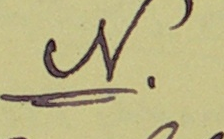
N
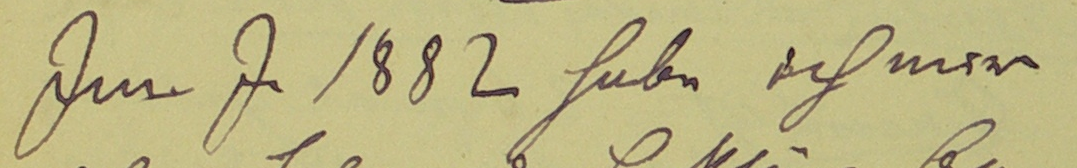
Im Jahre 1882 habe ich mir
